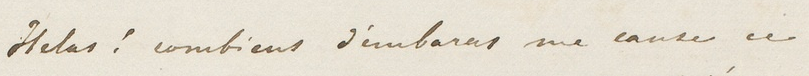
Helas! combiens d'embaras me cause ce
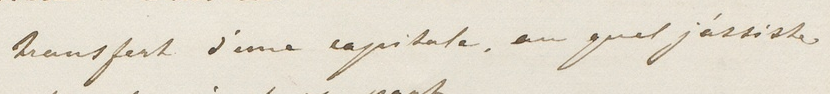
transfert d'une capitale, au quel j'assiste
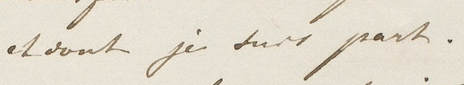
et dont je suis part.
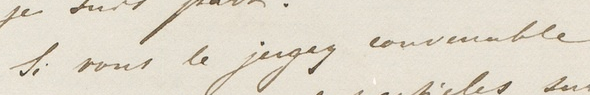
Si vous le jugez convenable
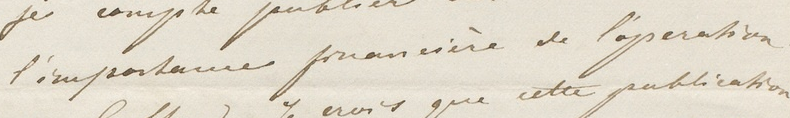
l'importance financière de l'operation
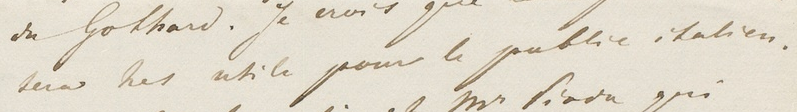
sera tres utile pour le public italien.
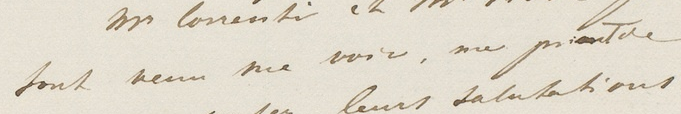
sont venu me voir, me prient de
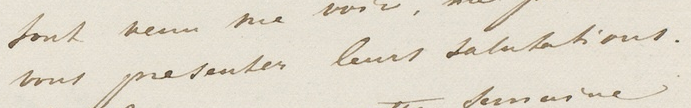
vous presenter leurs salutations.
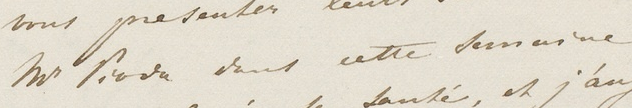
MrPioda dans cette semaine
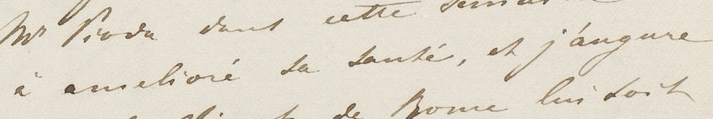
à amelioré sa santé, et j'augure
